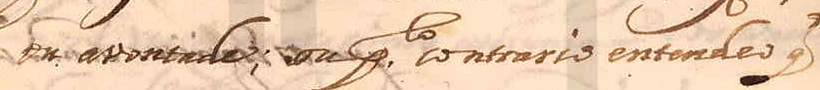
ou a vontade, ou p.lo contrario entendeo q̄
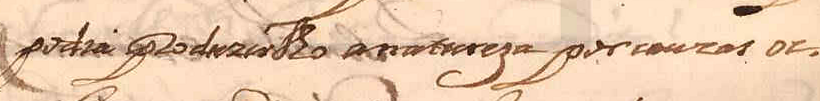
podia produzirlho a natureza por cauzas oc
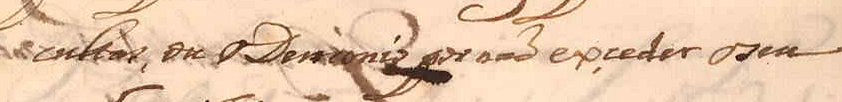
cultas, ou o Demonio por naõ exceder o seu
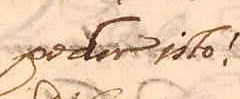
poder isto?
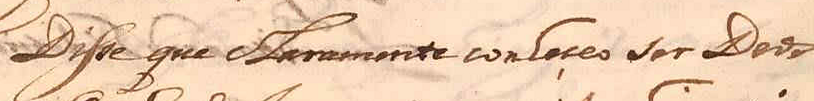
Disse que claramente conheceo ser Deos
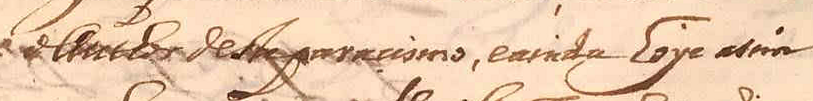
o Author deste paracismo, e ainda hoye asim
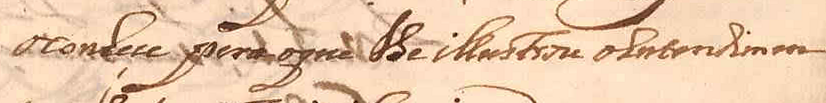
o conhece pera o que lhe illustrou o Entendimen
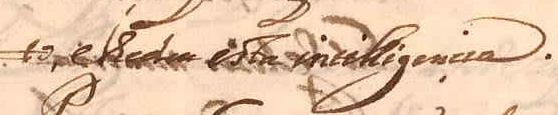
to, e lhe deu esta intelligencia.
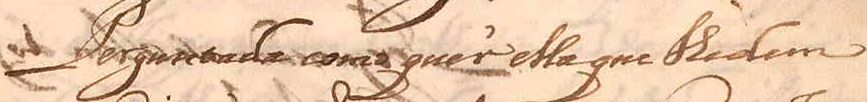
Perguntada como quer ella que lhe dem
